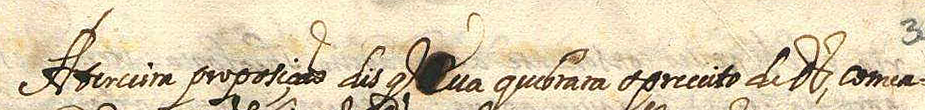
A terceira proposiçaõ dis q̄ Eua quebrara o preceito de ds̄ comen
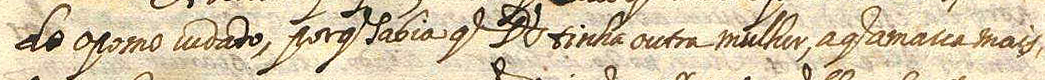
do o pomo uedado, porq̄ sabia q̄ Ds̄ tinha outra mulher, a q̄ amasse mais,
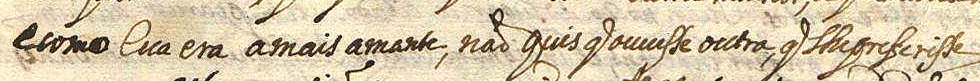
e como Eua era a mais amante, naõ quis q̄ ouuesse outra, q̄ lhe preferisse
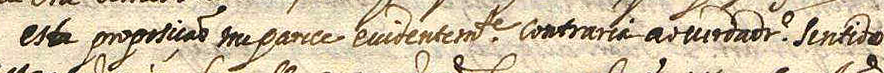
esta proposiçaõ me parece euidentem.te contraria ao uerdadr.o sentido
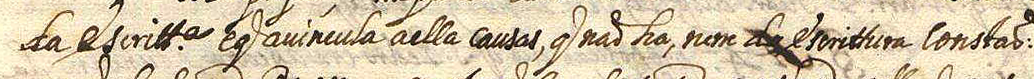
da escritt.a e q̄ a uincula a ella causas, q̄ naõ ha, nem de escrittura constaõ.
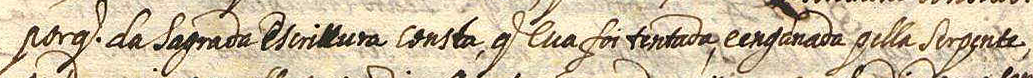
porq.to da Sagrada Escrittura consta, q̄ Eua foi tentada, e enganada pella serpente
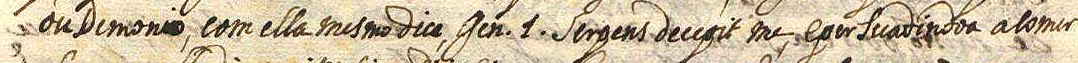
ou Demonio, com ella mesmo dice Gen. 1. Serpens decepit me, e persuadindoa a comer
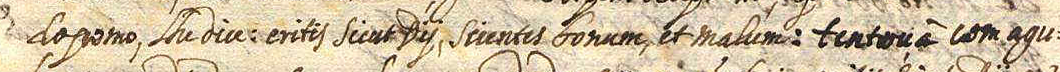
do pomo, lhe dice: eritis sicut Dij, scientes bonum, et malum: tentoua com a gu
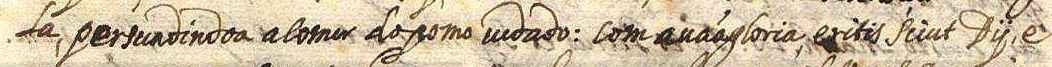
La, persuadindoa a comer do pomo uedado: com a uaã gloria, eritis sicut Dij, e
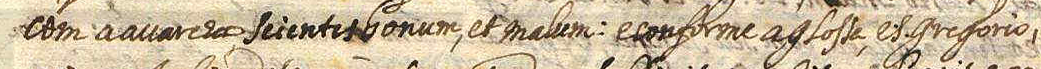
com a auareza scientes bonum, et malum: e conforme a glossa, e s. Gregorio,
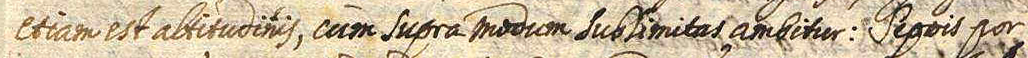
etiam est altitudinis, cum supra modum sublimitas ambitur: Depois por
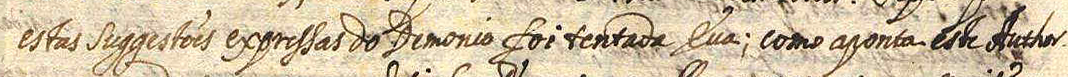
estas suggestoẽs expressas do Demonio foi tentada Eua; como aponta este Author
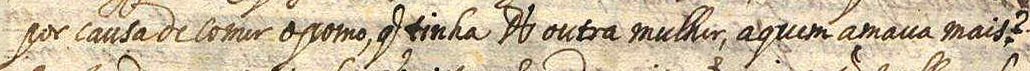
por causa de comer o pomo, q̄ tinha Ds̄ outra mulher, a quem amaua mais?
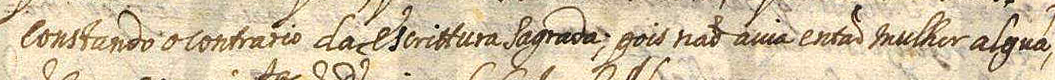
constando o contrario da escrittura Sagrada, pois naõ auia entaõ mulher alguā
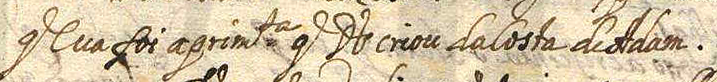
q̄ Eua foi a prim.ra q̄ Ds criou da Costa de Adam.
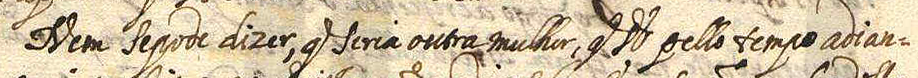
Nem se pode dizer, q̄ seria outra mulher, q̄ Ds̄ pello tempo adian
